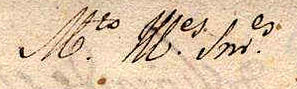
M.to Ill.es Snr.es
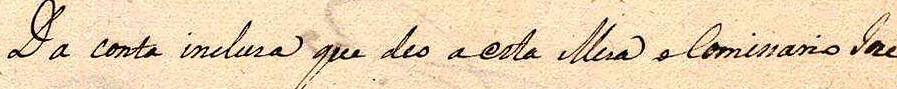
Da conta incluza que deo a esta Mesa o Comissario Iozé
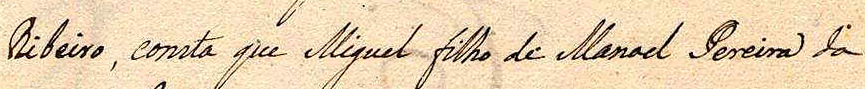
Ribeiro, consta que Miguel filho de Manoel Pereira da
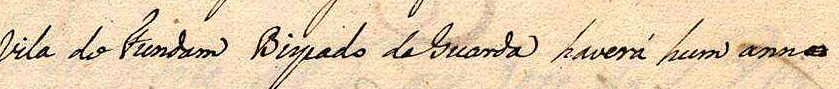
Vila do Fundam Bispado da Guarda haverá hum anno
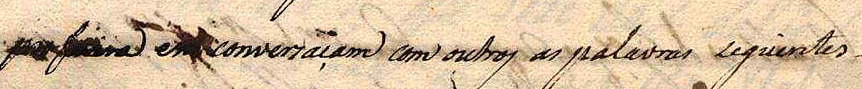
proferira em conversaçam com outros as palavras seguintes
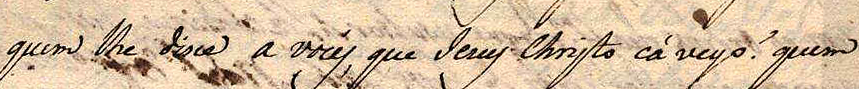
quem lhe disce a voces, que Iezus Christo cá veyo? quem
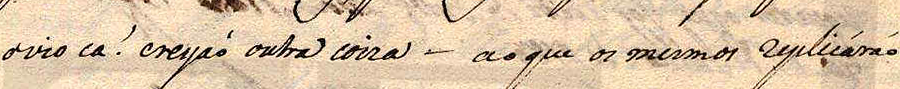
o vio ca? creyaõ outra coiza - ao que os mesmos replicáraõ
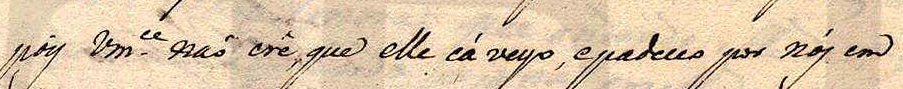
pois vm.ce naõ crê, que elle cá veyo, e padeceo por nós em
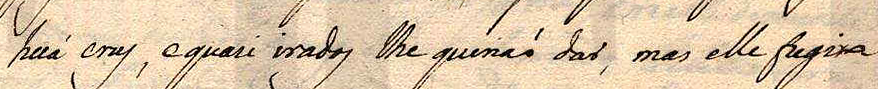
huā crus, e quasi irados lhe queriaõ dar, mas elle fugira
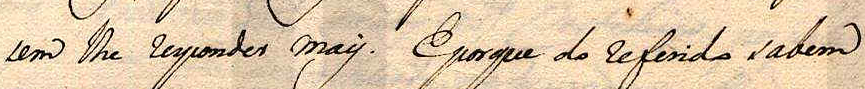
sem lhe responder mais. E porque do referido sabem
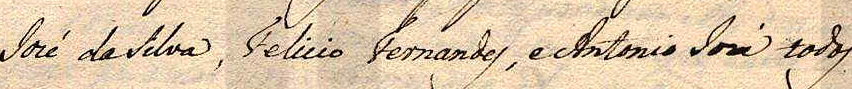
Iozé da Silva, Felicio Fernandes, e Antonio Iozé todos
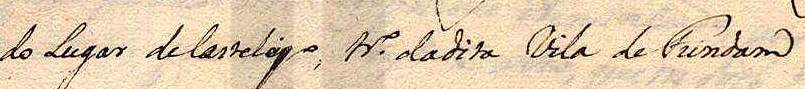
do Lugar de Castelejo, tr.o da dita Vila do Fundam.
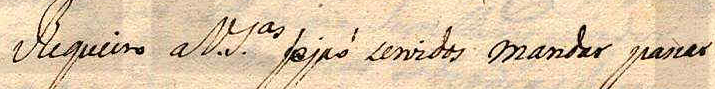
Requeiro a V.S.as sejaõ servidos mandar passar
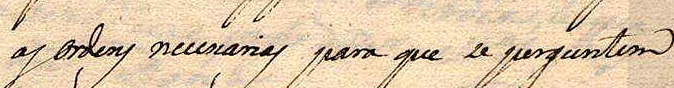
as ordens necessarias para que se perguntem
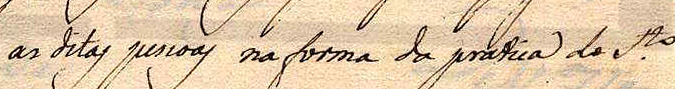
as ditas pessoas na forma da pratica do s.to
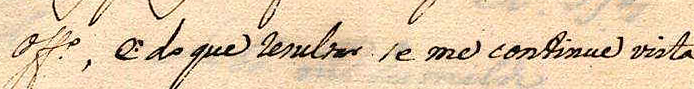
Off.o e do que resultar se me continue vista
